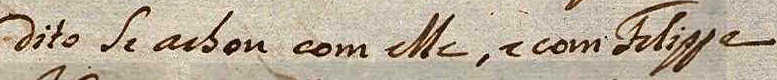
dito Se achou com elle, e com Felippa
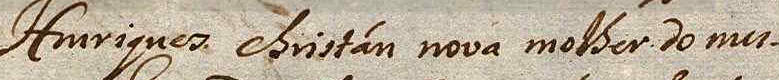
Henriques christán nova molher do mes
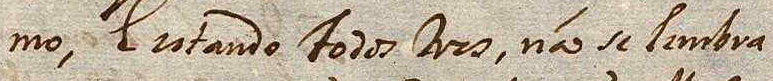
mo, E estando todos tres, não se lembra
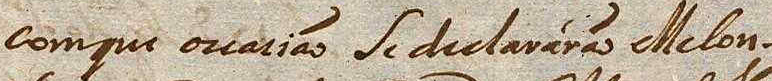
com que occasião Se declarárão elle Con
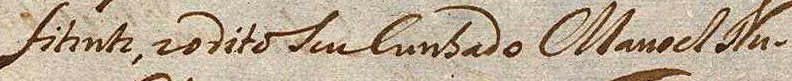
fitente, e o dito Seu Cunhado Manoel Nu
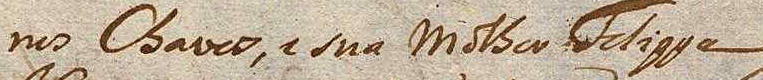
nes Chaves, e sua molher Felippa
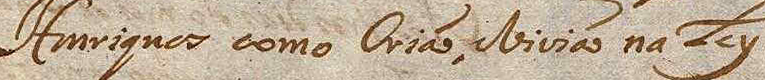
Henriques como Criaõ, e Viviaõ na Ley
